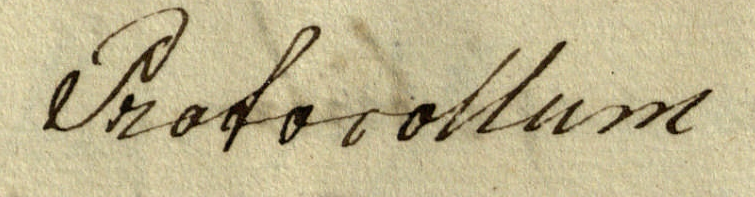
Protocollum
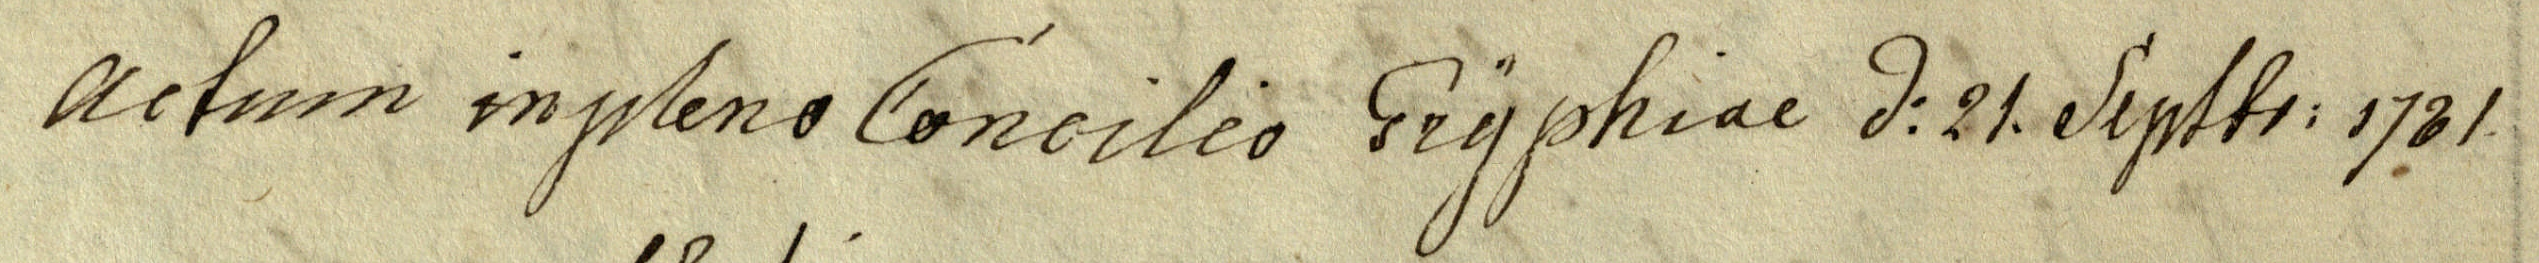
Actum in pleno Concilio Grÿphiae d: 21. Septbr: 1781
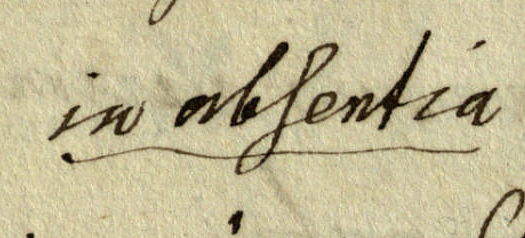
in absentia
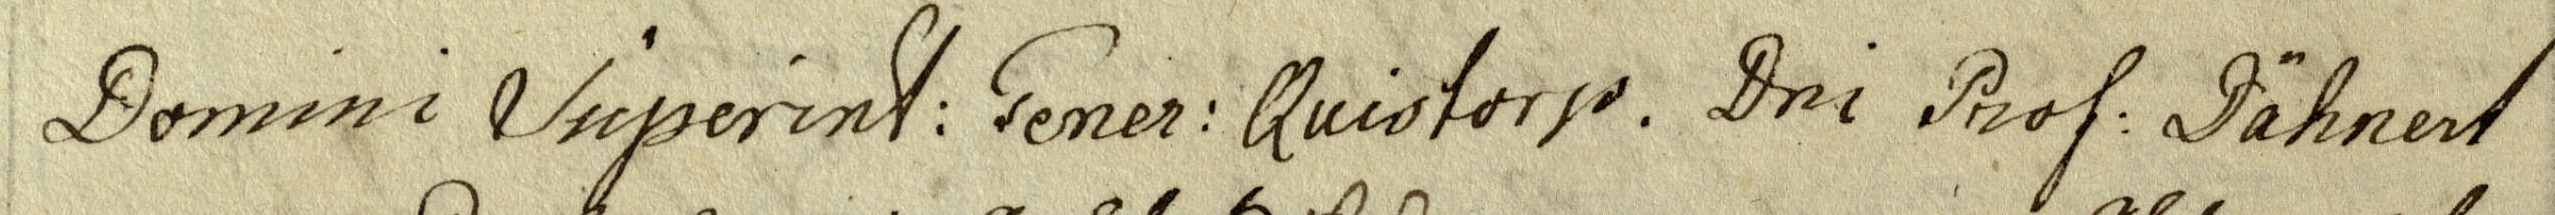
Domini Superint: Gener: Quistorp. Dei Prof: Dähnert
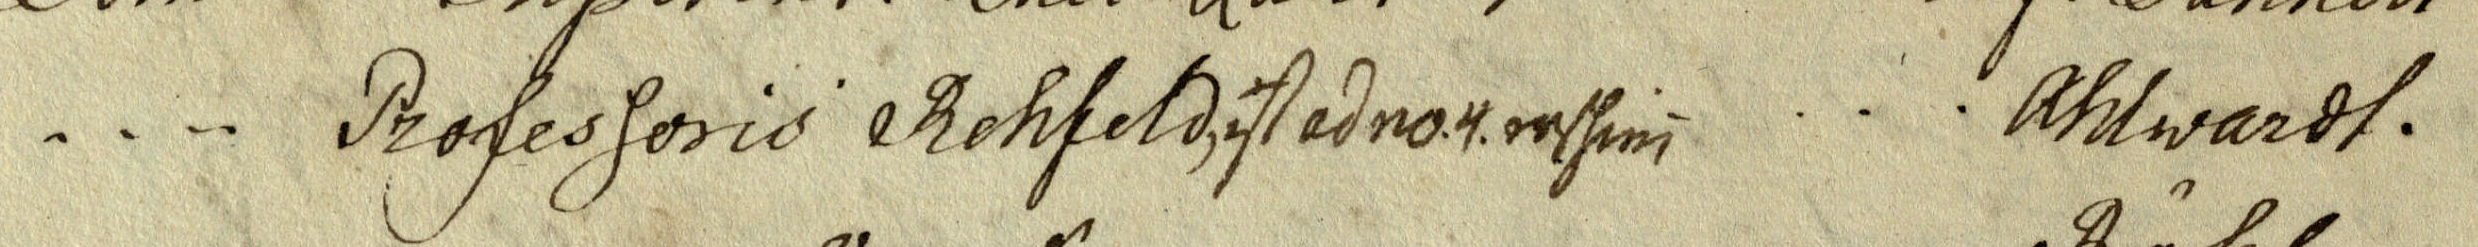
Professoris Rehfeld, ist ad no. 4 erschie Ahlwardt
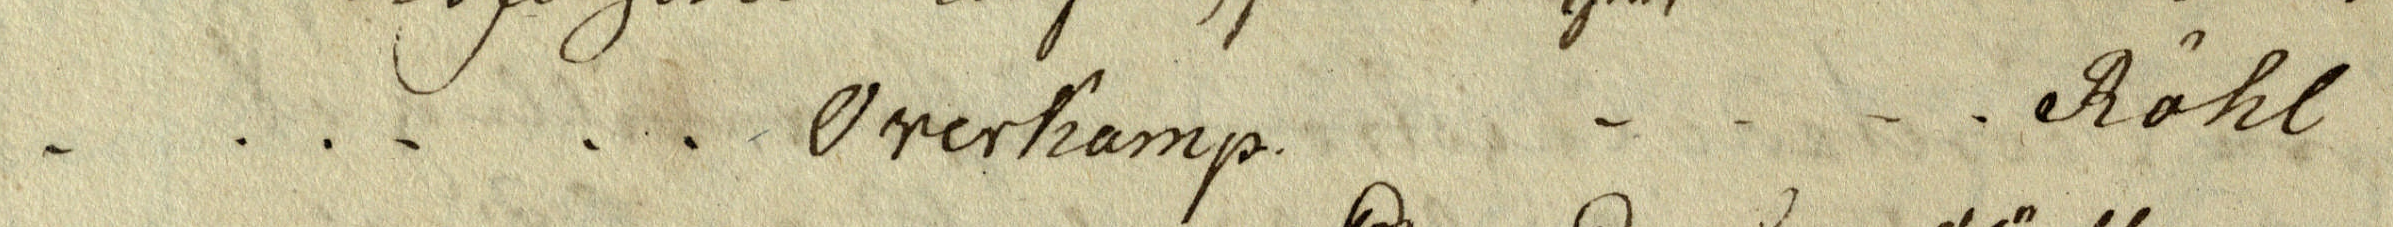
Overkamp Röhl
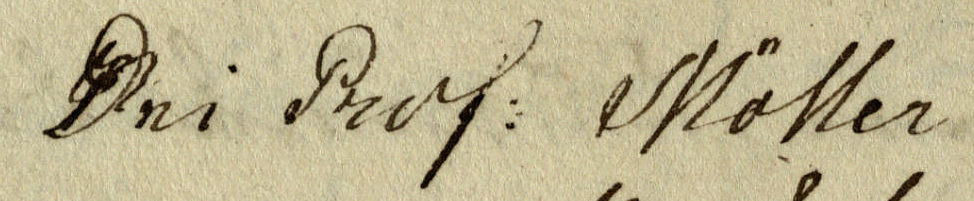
Dei Prof: Möller
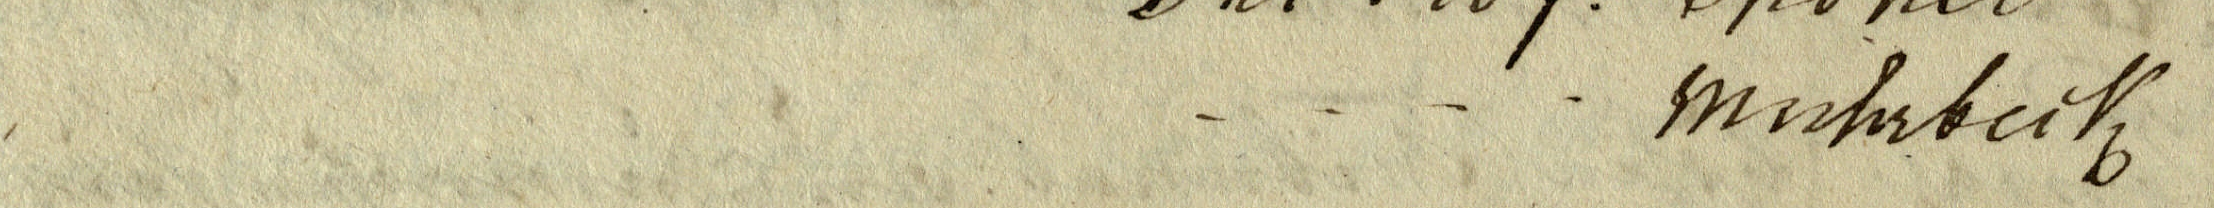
Muhrbeck
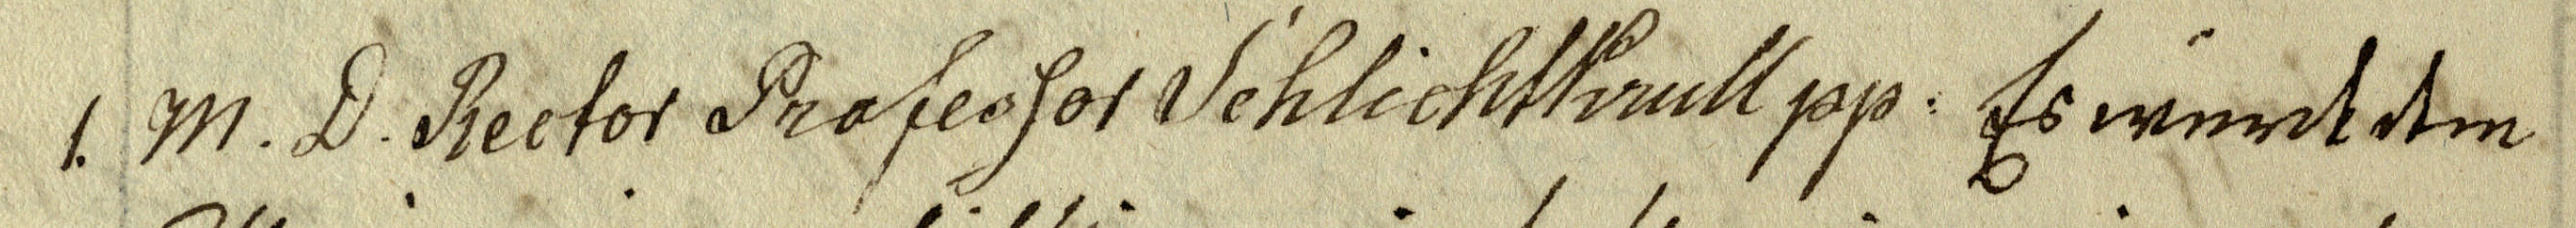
M. D. Rector Professor Schlichtkrull pp: Es würde dem
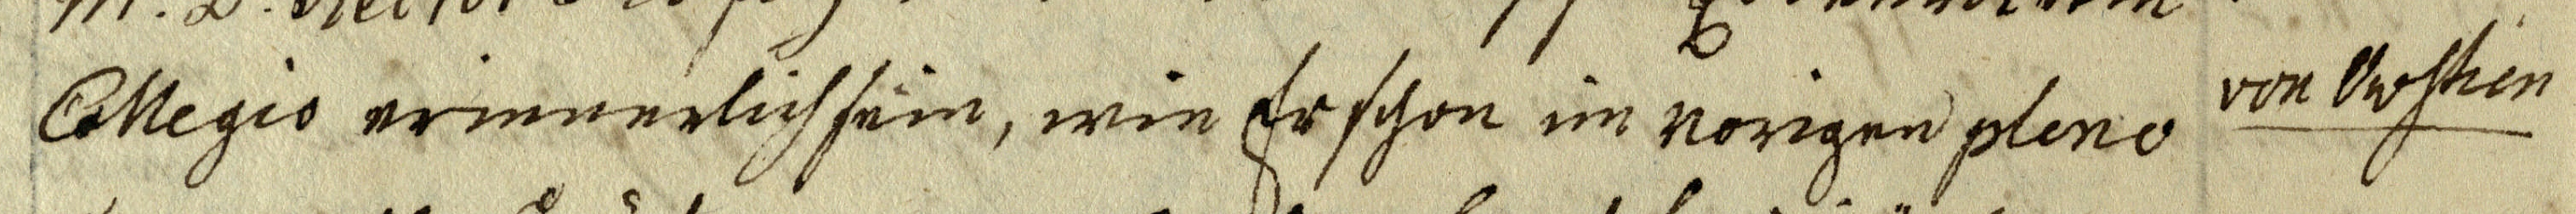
Collegio erinnerlich sein, wie Er schon im vorigen pleno
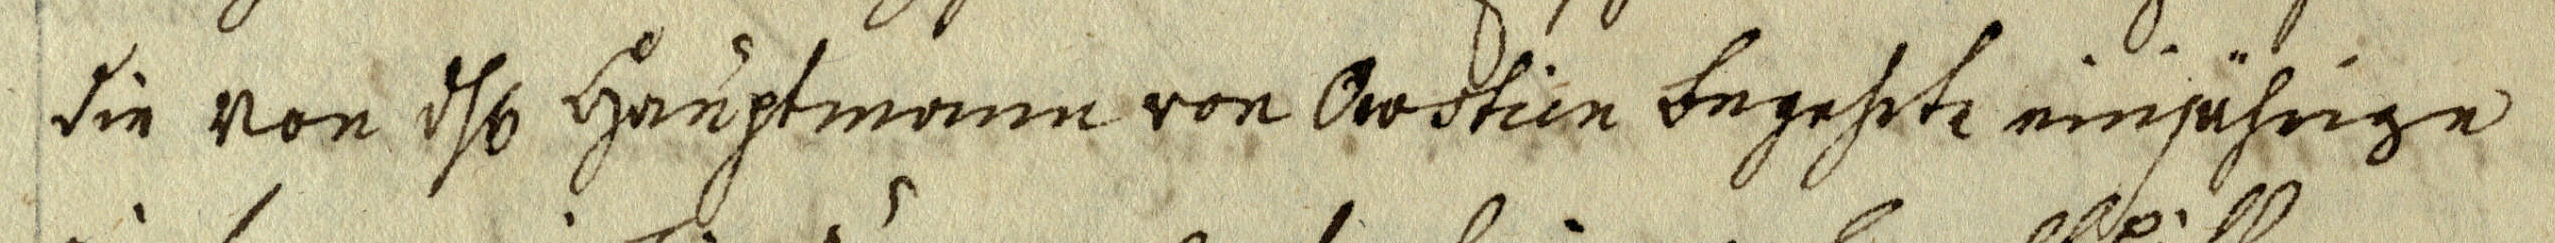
die von dh Hauptmann von Owstien begehrte einjährige
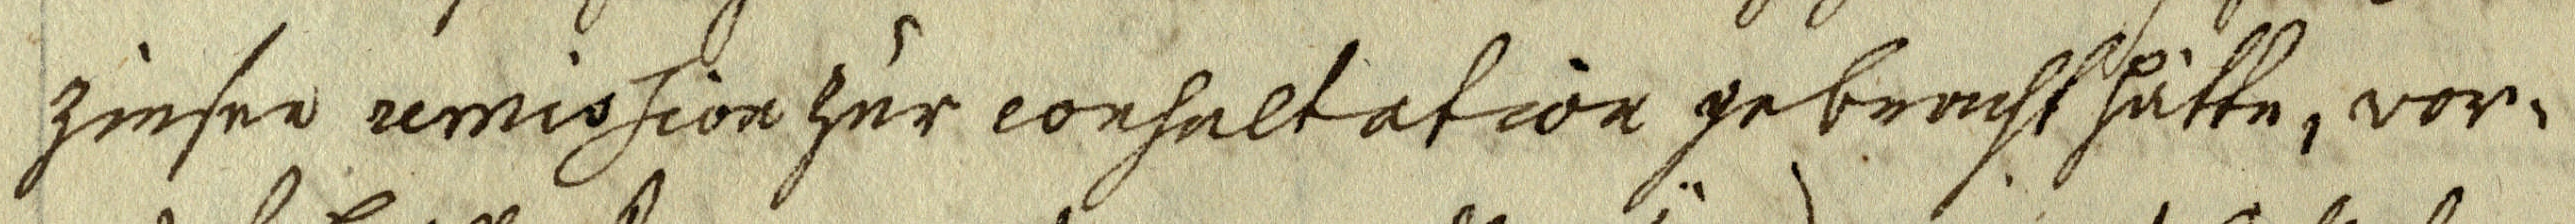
Zinsen remission zur consultation gebracht hätte, vor¬
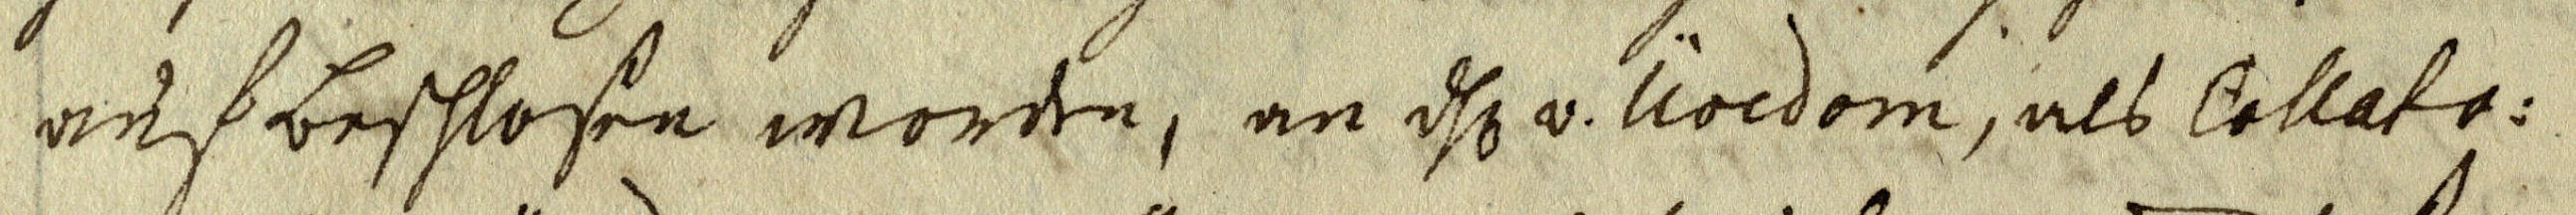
auf beschlossen worden, an dh v. Usedom, als Collato¬
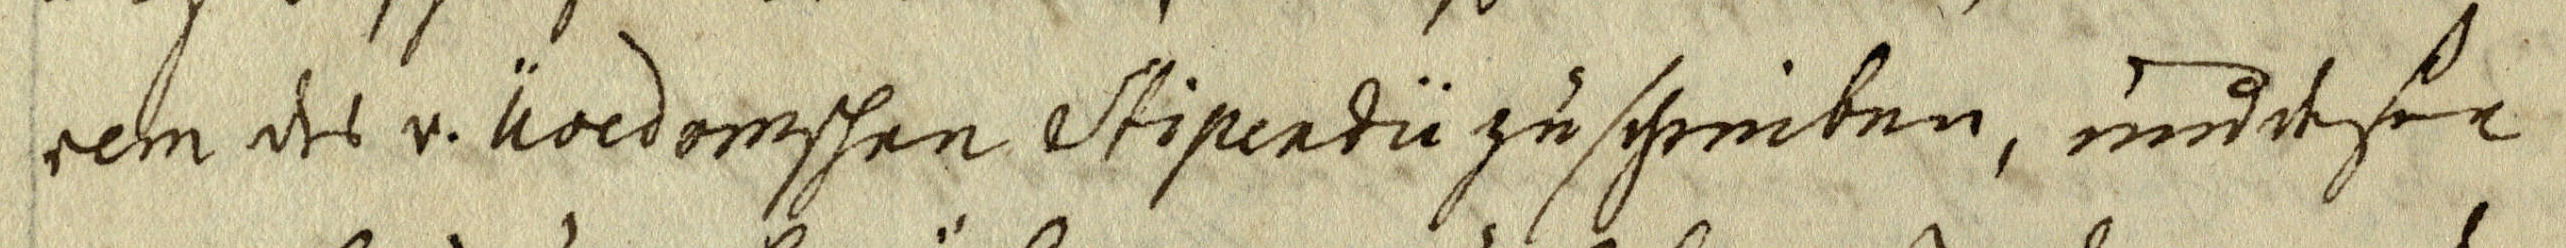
rem der v. Usedomschen Stipendii zu schreiben, und deßen
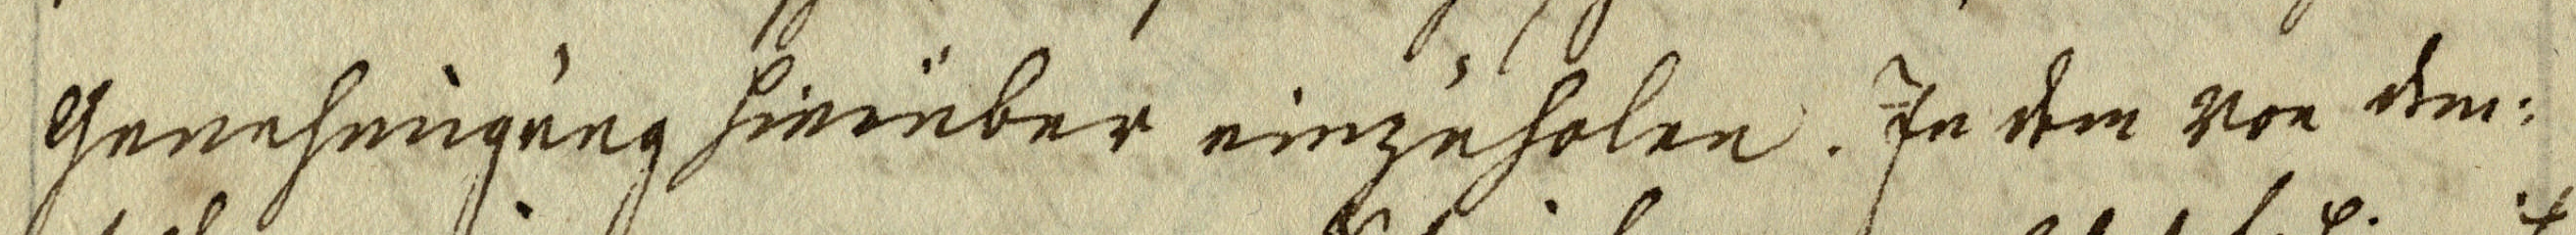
Genehmigung hierüber einzuholen. In dem von dem¬
